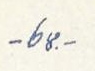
68
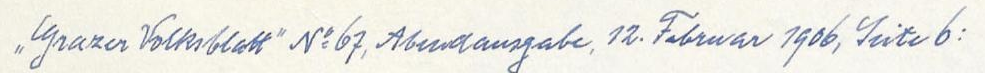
„Grazer Volksblatt“, Nr. 67, Ausgabe 12. Februar 1906, Seite 6:
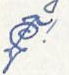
Cl!
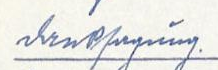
Danksagung
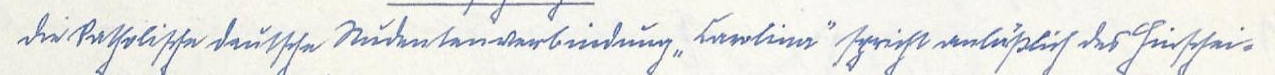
Die katholische deutsche Studentenverbindung „Carolina“ spricht anläßlich des Hinschei-
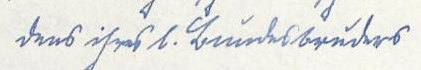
dens ihres l. Bundesbruders
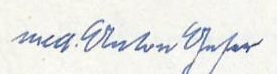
med. Anton Geser,
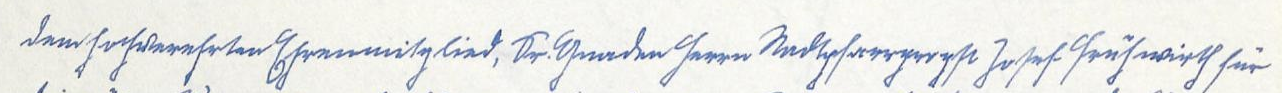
dem hochverehrten Ehrenmitglied, Se. Gnaden Herrn Stadtpfarrprobst, Josef Frühwirth für
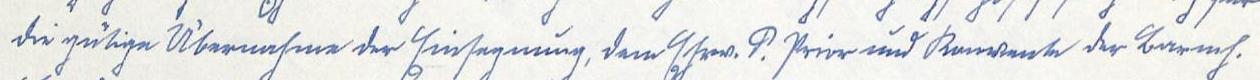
die gütige Übernahme der Einsegnung, dem ehrw. P. Prior und Konvente der Barmh.
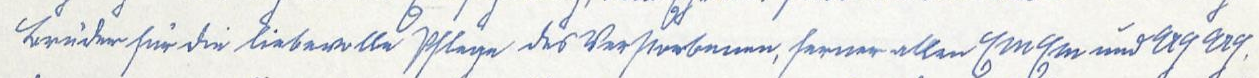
Brüder für die liebevolle Pflege des Verstorbenen, ferner allen EM EM und AH AH,
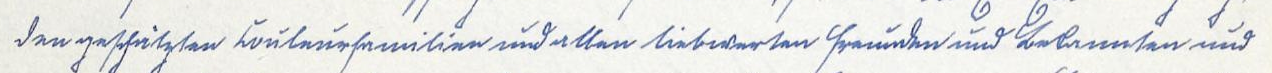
den geschätzten Couleurfamilien und allen liebwerten Freunden und Bekannten und
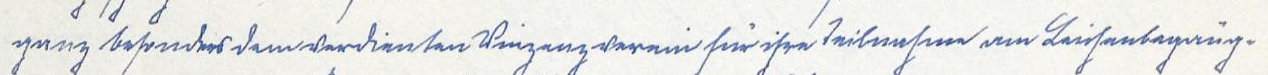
ganz besonders dem verdienten Vinzenzverein für ihre Teilnahme an Leichenbegäng-
